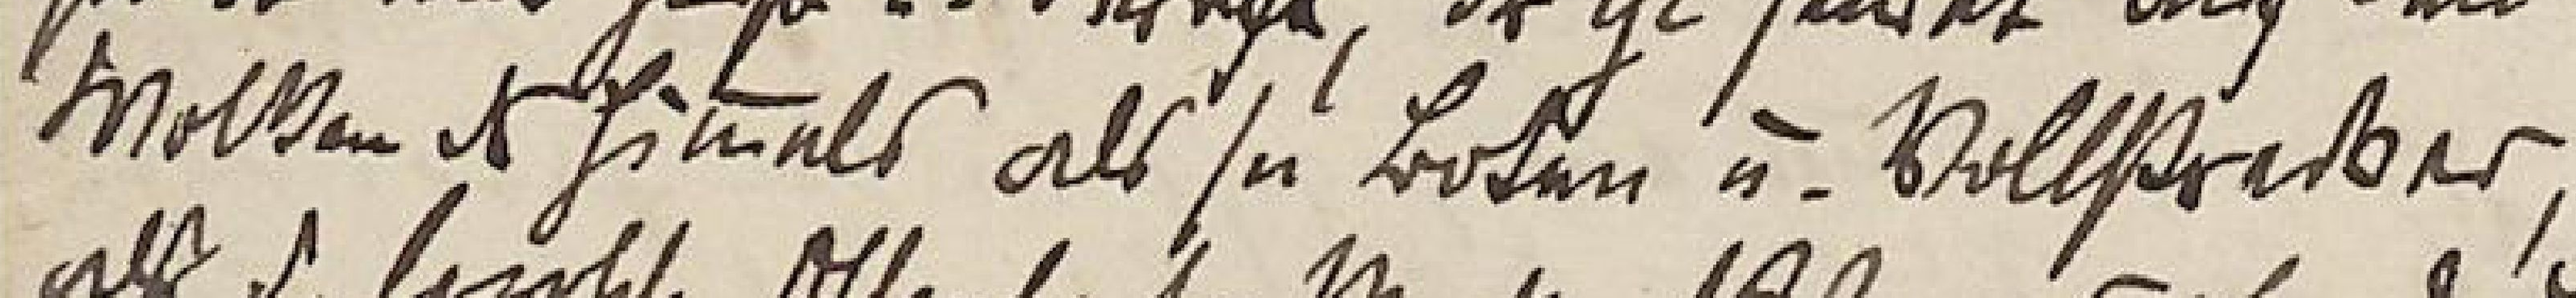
Wolken ds Himels als sn Boten u. Vollstreker,
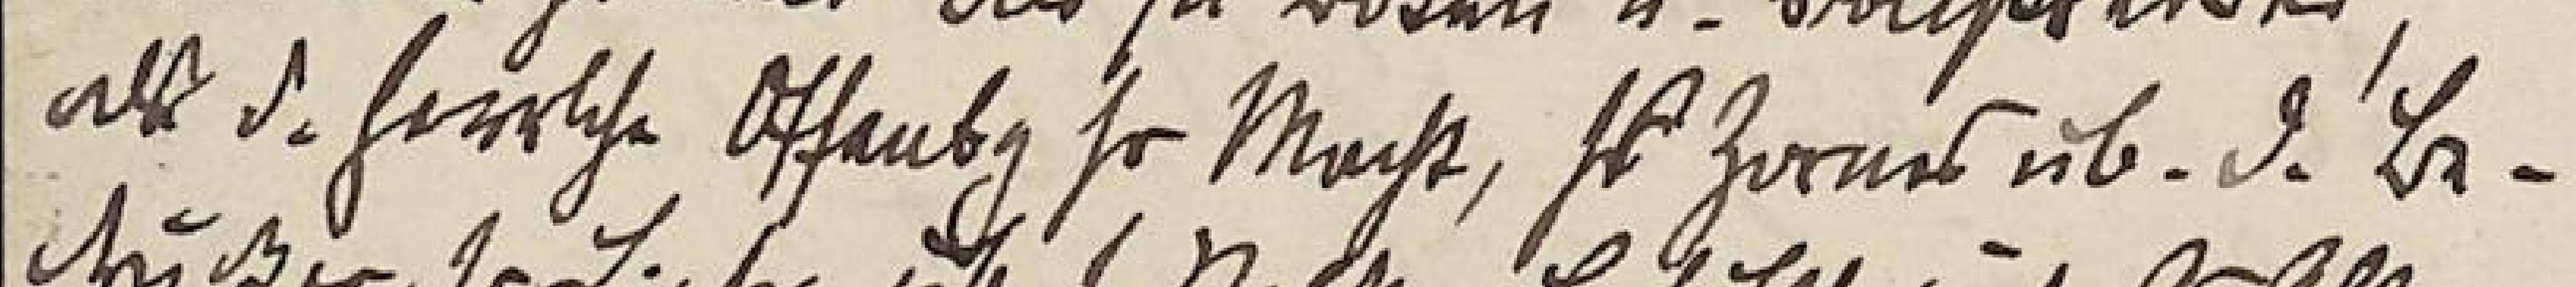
als d. herrliche Offenbg sr Macht, Gs Zornes üb. d. Be¬
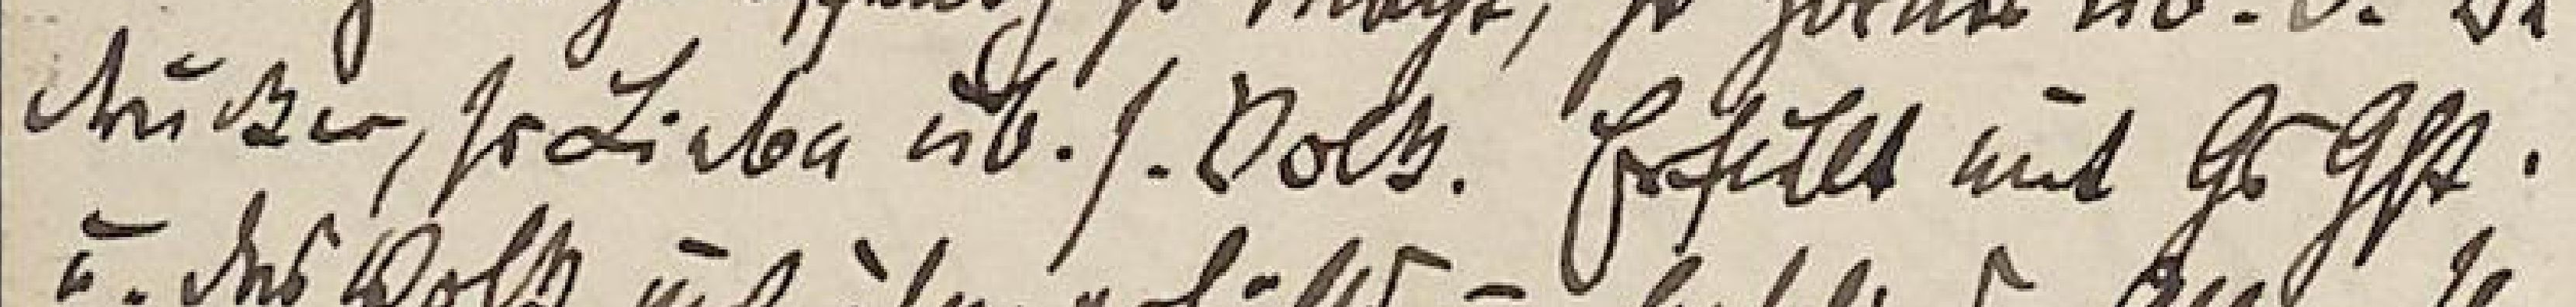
drücker, sr Liebe üb. s. Volk. Erfüllt mit Gs Gst.
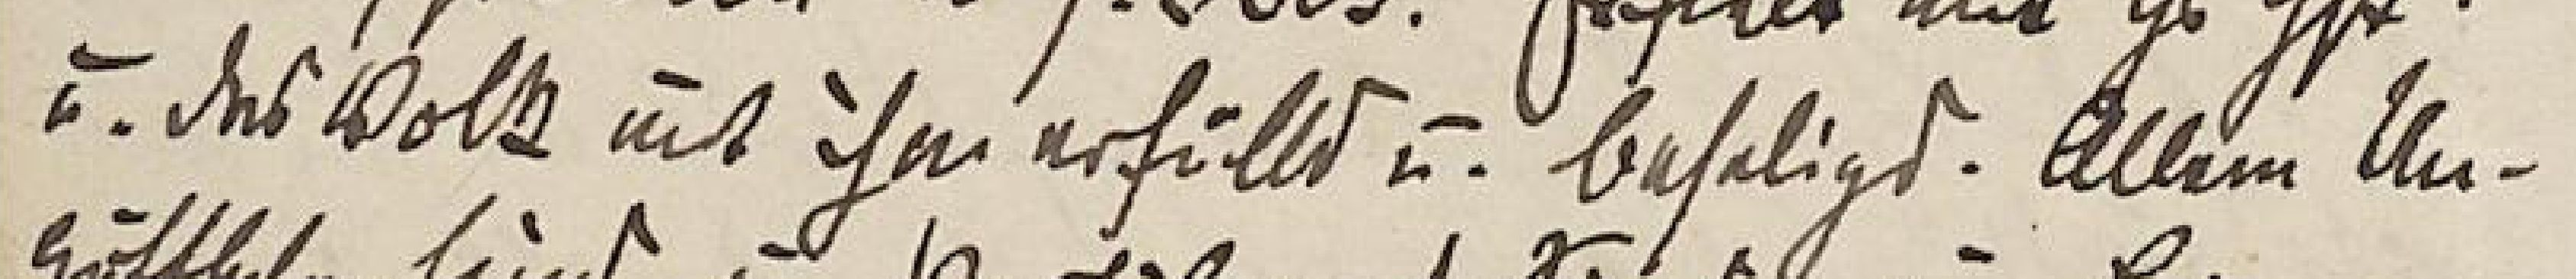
u. das Volk mit ihm erfülld. u. beseligd. Allem Un¬
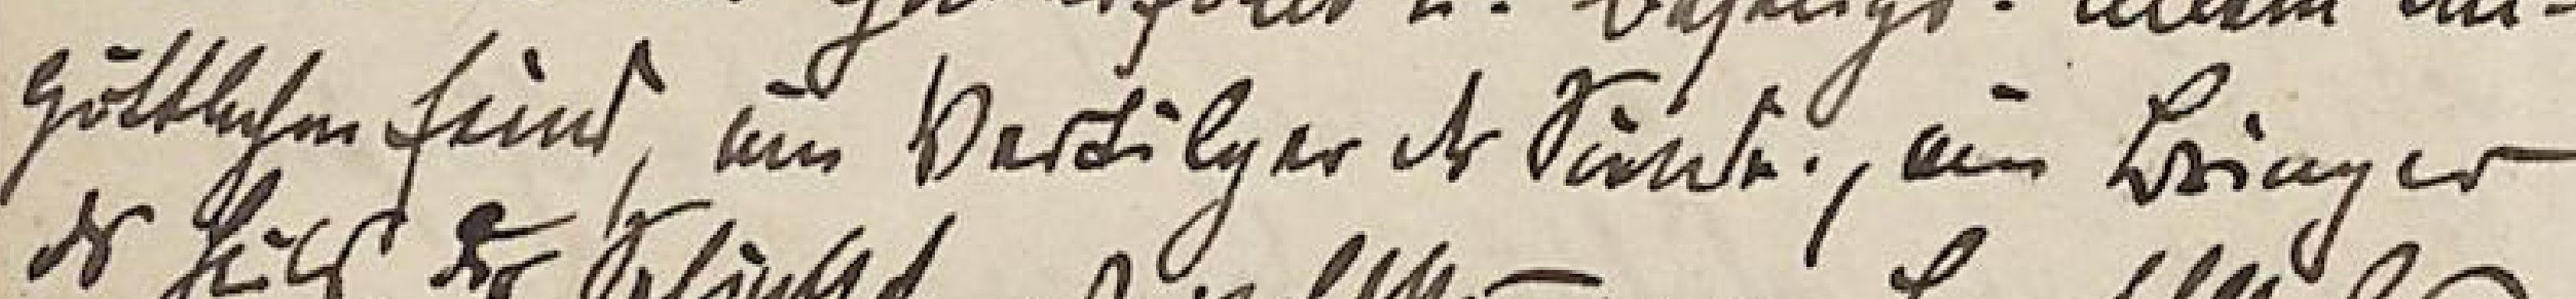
göttlichen feind, ein Vertilger der Sünd, ein Bringer
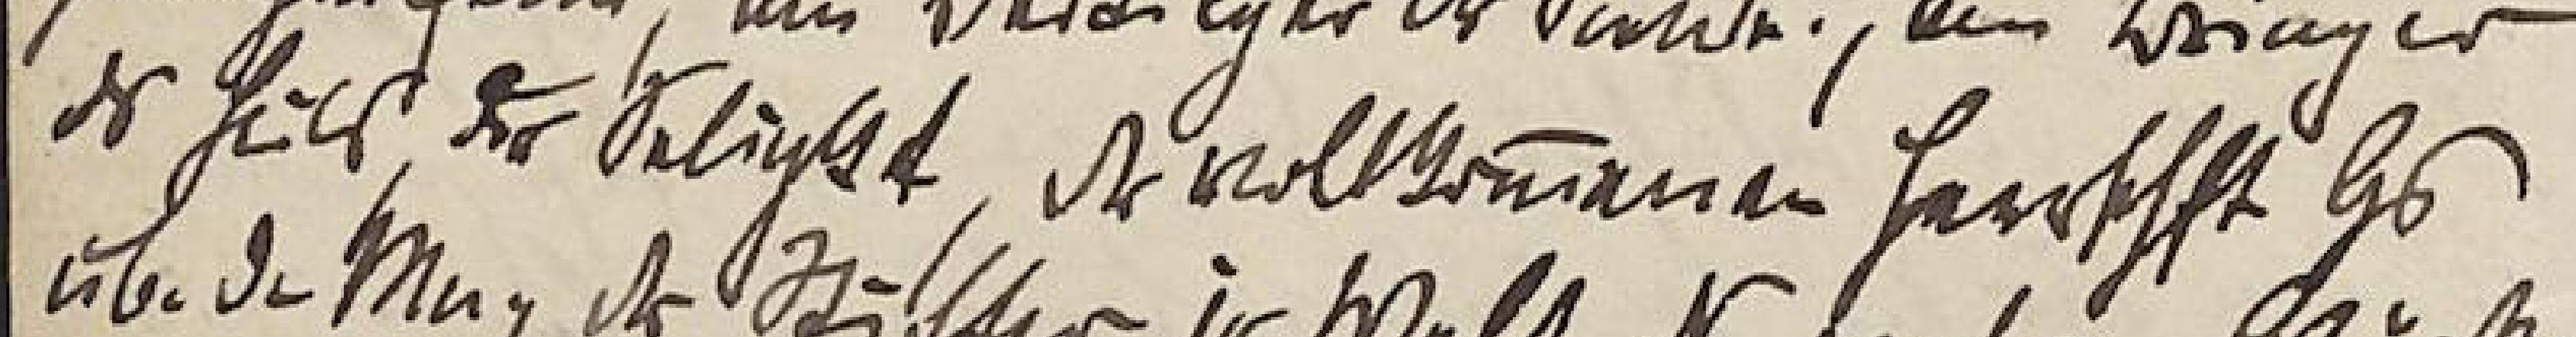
ds Heils, der Seligkt, der vollkomenen Herrschafft Gs
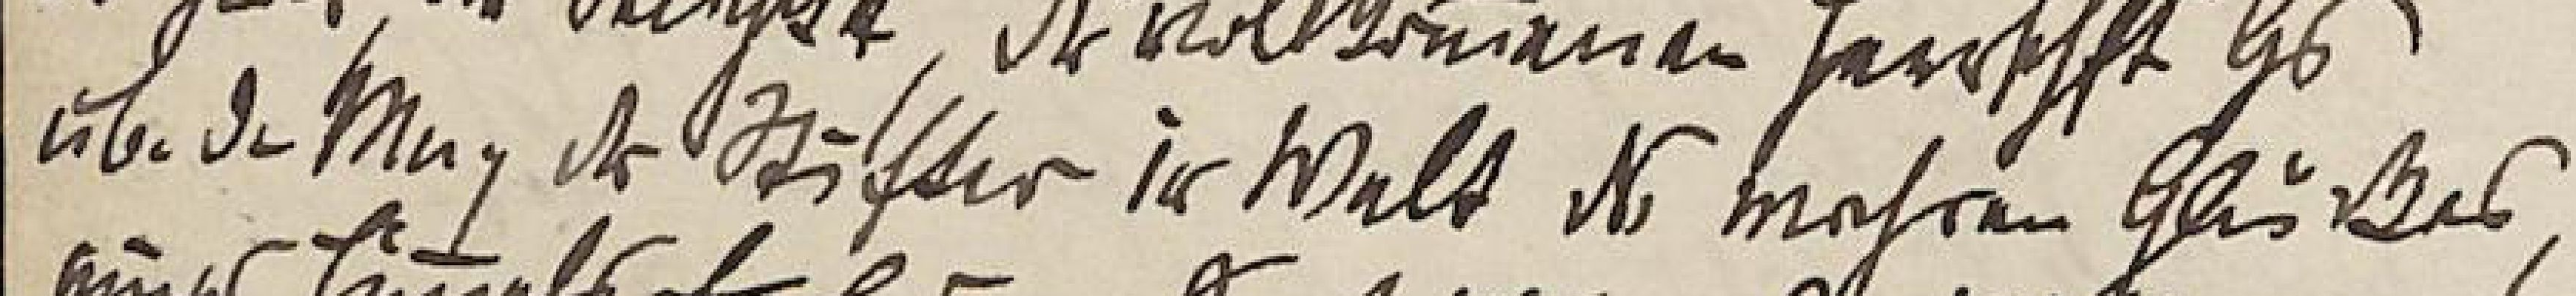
über d. Mn., der Stifter 1r Welt ds wahren Glückes,
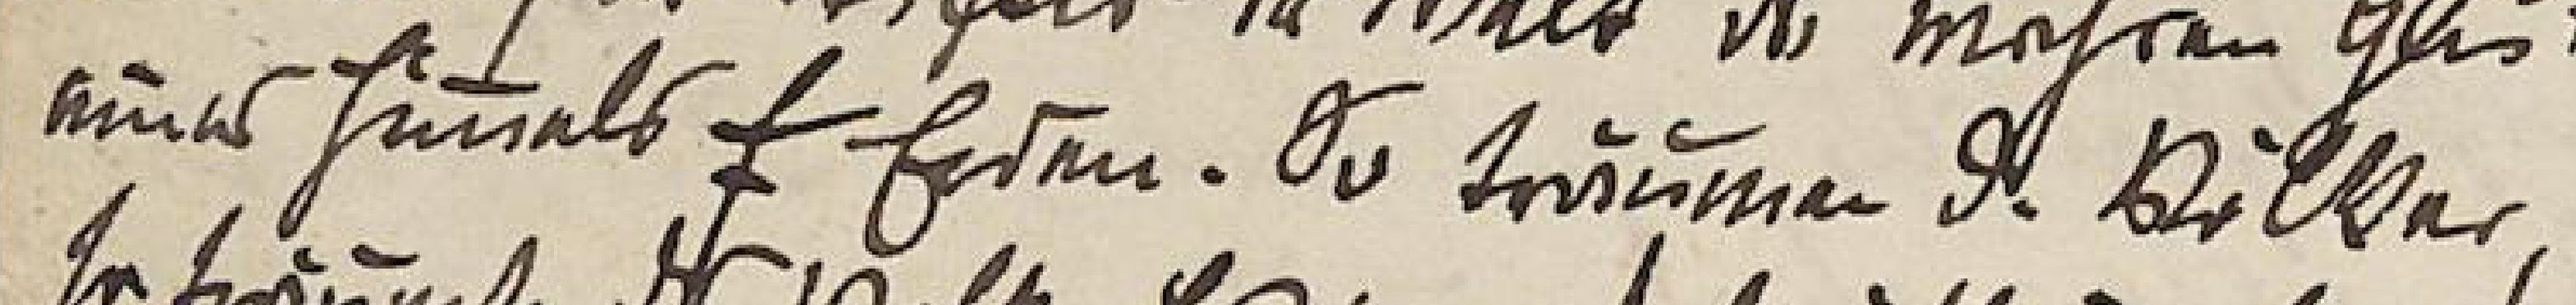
eines Himels f. Erden. So träumen d. Völker,
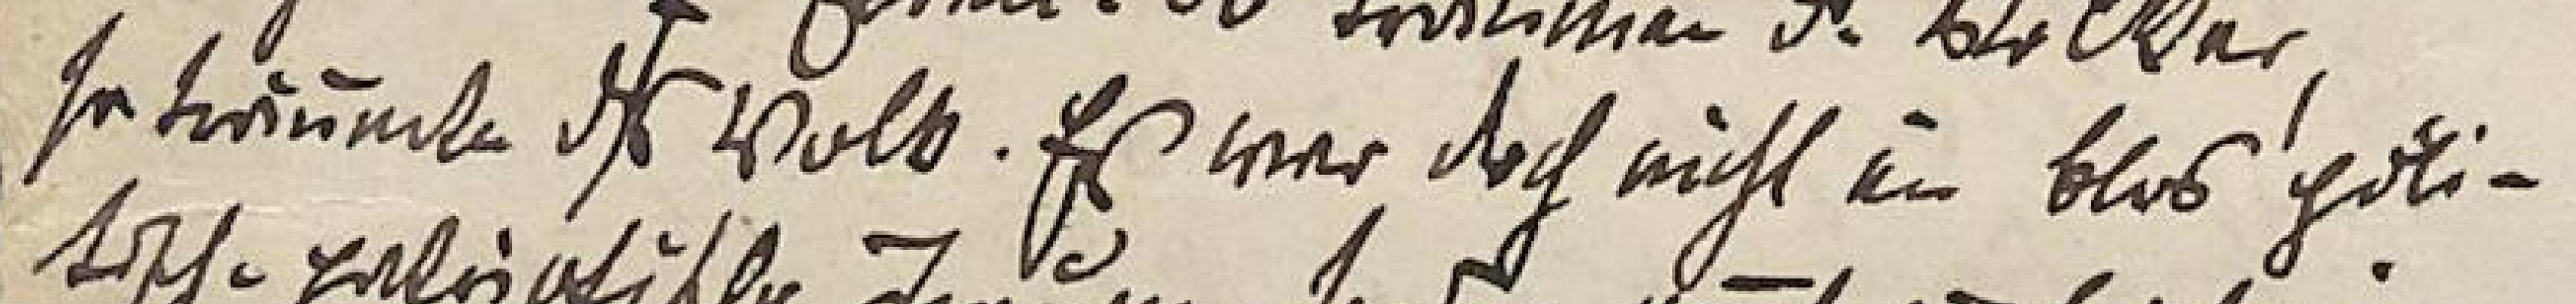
so träumte dss Volk. Es war doch nicht ein blos poli¬
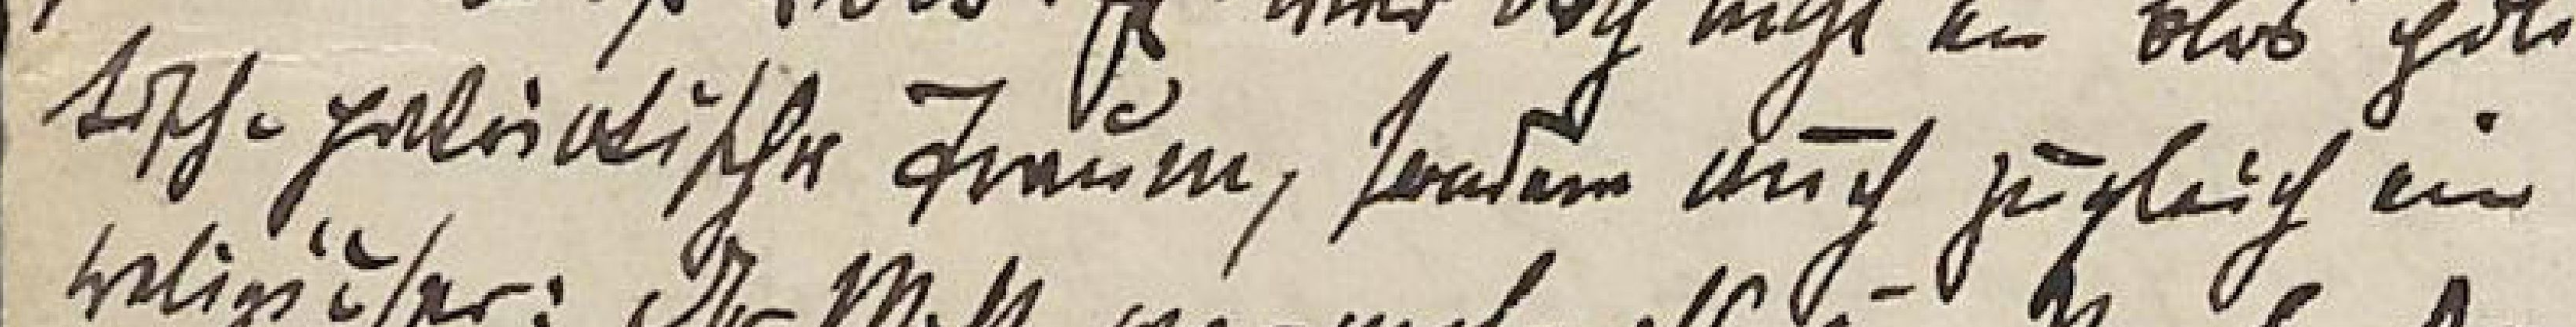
tisch-patriotischer Traum, sondern auch zugleich ein
